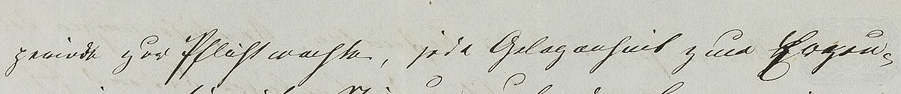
periode zur Pflicht machte, jede Gelegenheit zum Erzeu-
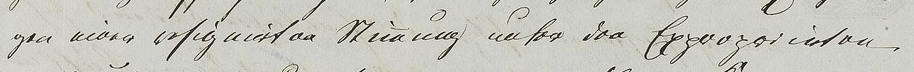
gen einer resignirten Stimmung unter den Expropriirten
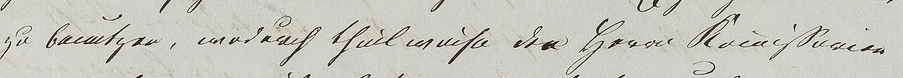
zu benutzen, wodurch theilweise den Herrn Kommissarien
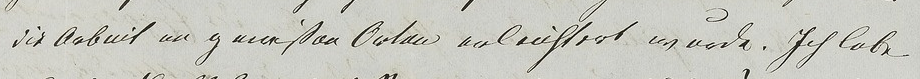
die Arbeit in gewissen Orten erleichtert wurde. Ich lebe
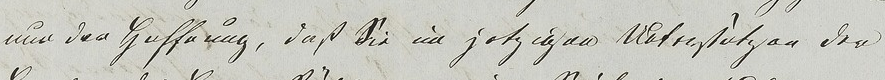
nun der Hoffnung, daß Sie im jetzigen Unterstützen der
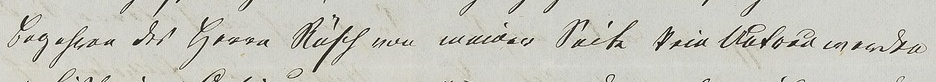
Begehren des Herrn Rüsch von meiner Seite kein Untreuwerden
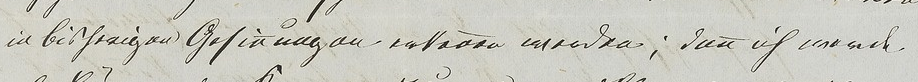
in bisherigen Gesinnungen erkennen werden; denn ich werde
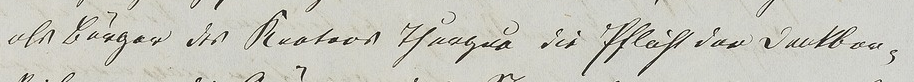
als Bürger des Kantons Thurgau die Pflicht der Dankbar-
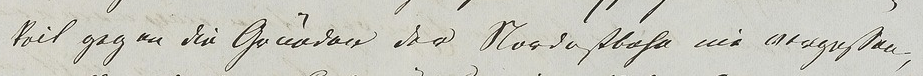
keit gegen die Gründer der Nordostbahn nie vergessen,
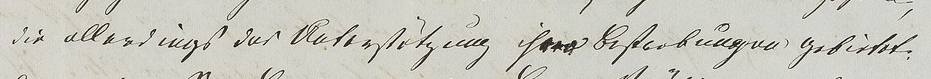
die allerdings der Unterstützung ihrer Bestrebungen gebietet.
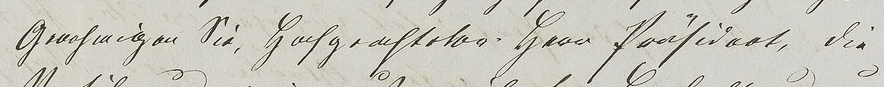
Genehmigen Sie, Hochgeachteter Herr Präsident, die
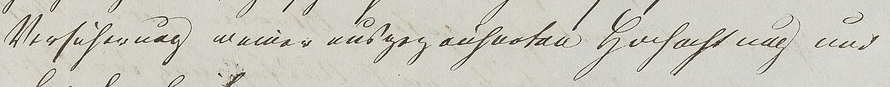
Versicherung meiner ausgezeichneten Hochachtung und
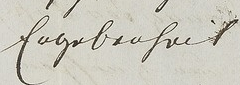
Ergebenheit
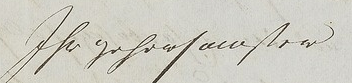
Ihr gehorsamster
